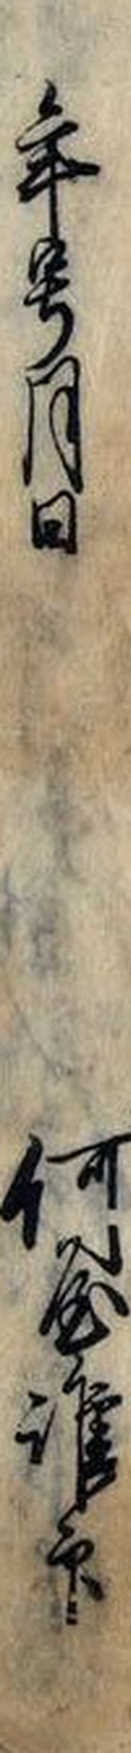年号月日何屋誰印
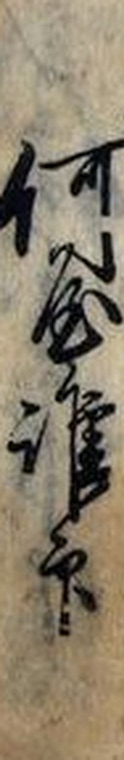何屋誰殿

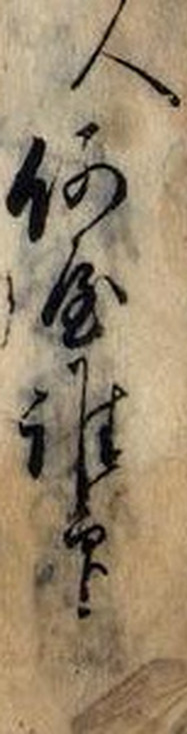何屋誰印
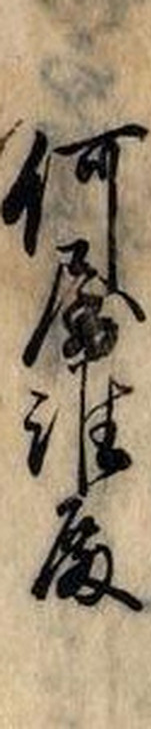何屋誰殿
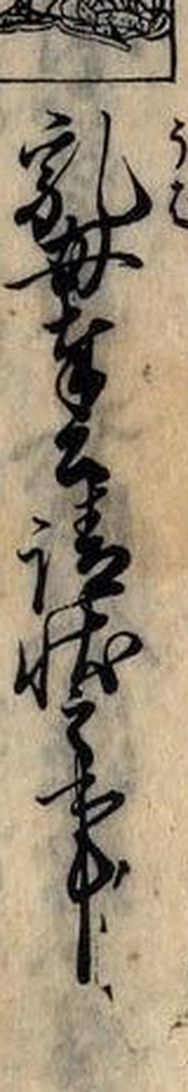乳母奉公請状之事
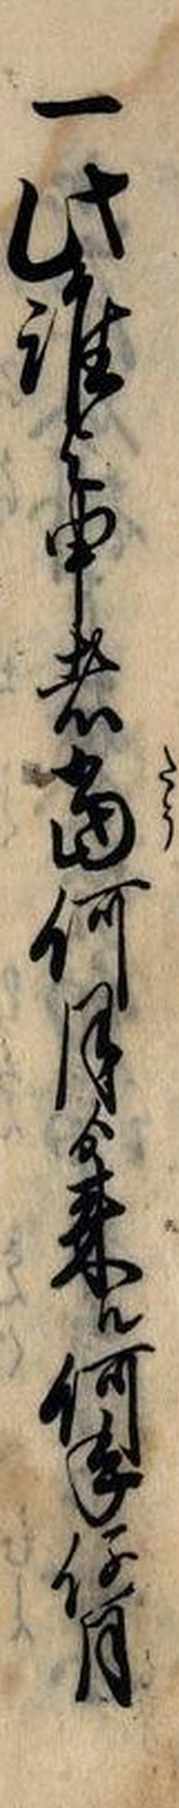一此誰与申者當何月ゟ来ル何年何月
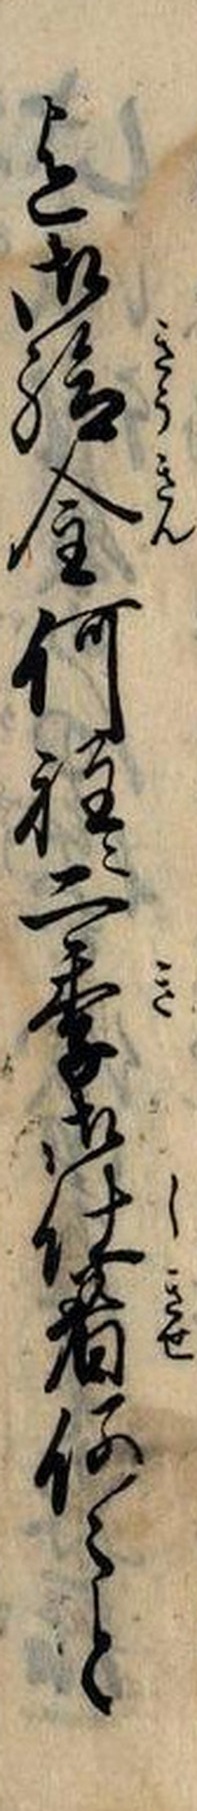迄御給金何程に二季御仕着何々と
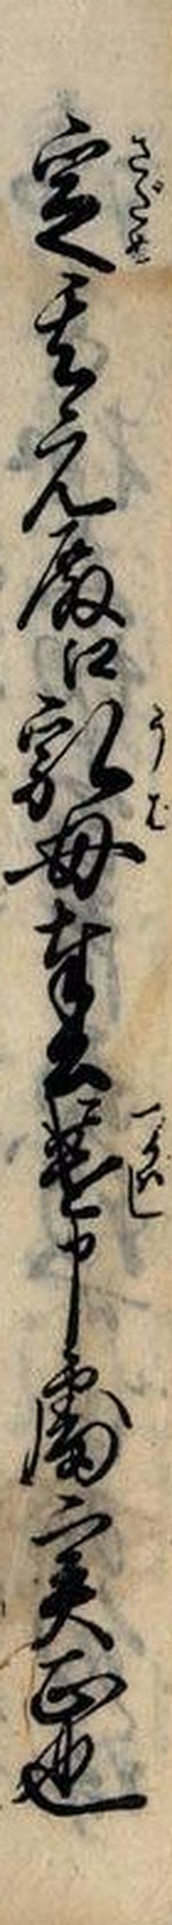定其元殿江乳母奉公遣申處実正也
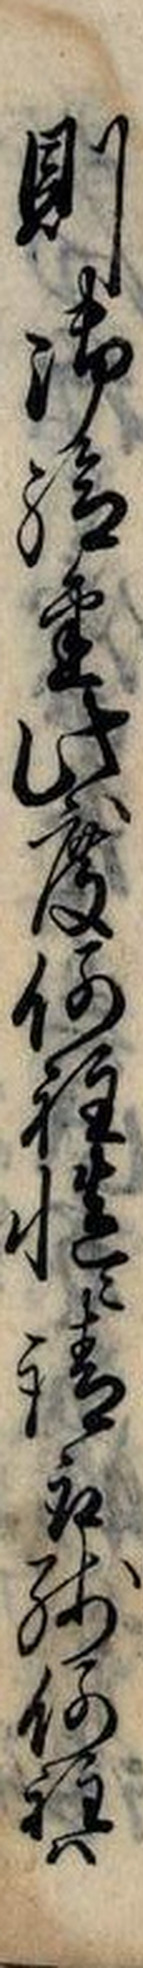則御給金此度何程慥に請取残何程は
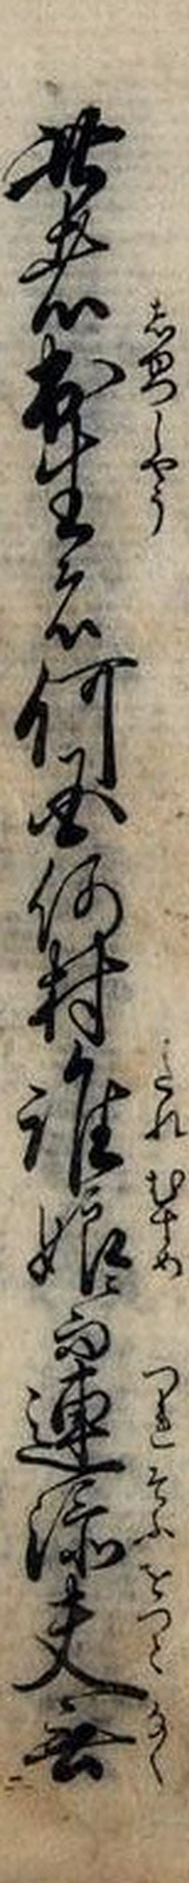此者出生者何国何村誰娘に而連添夫無
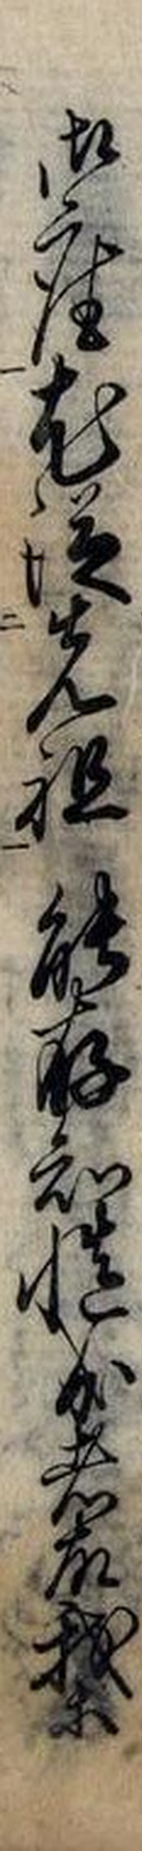御座尤従先祖能存知慥成者故我等
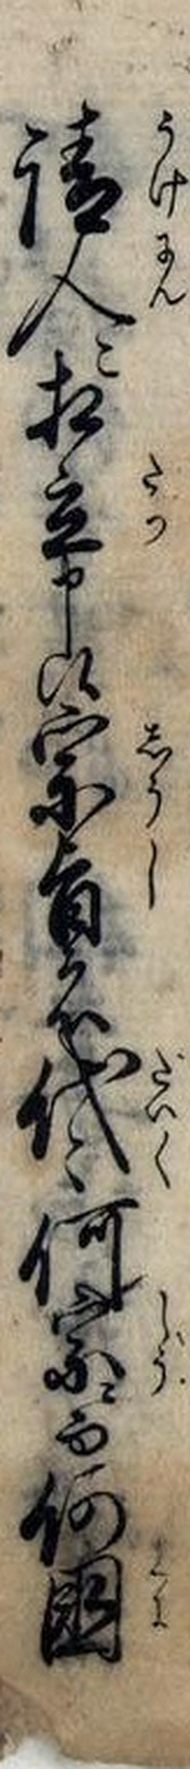請人に相立申候宗旨者代々何宗に而何國

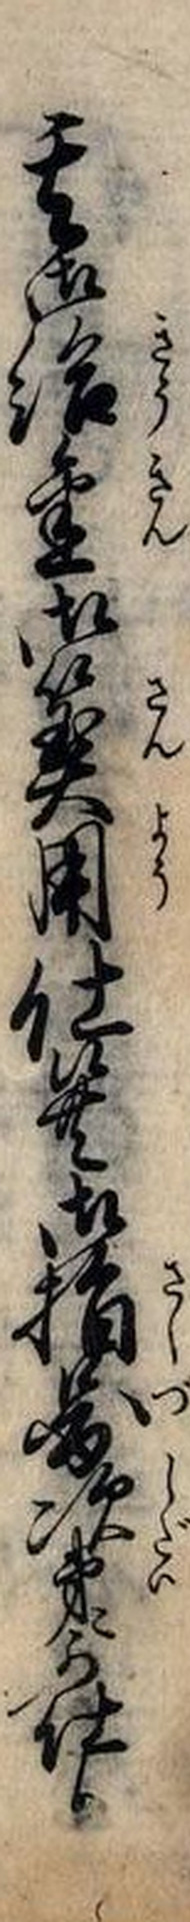其御給金御算用仕候共御指圖次第に可仕候
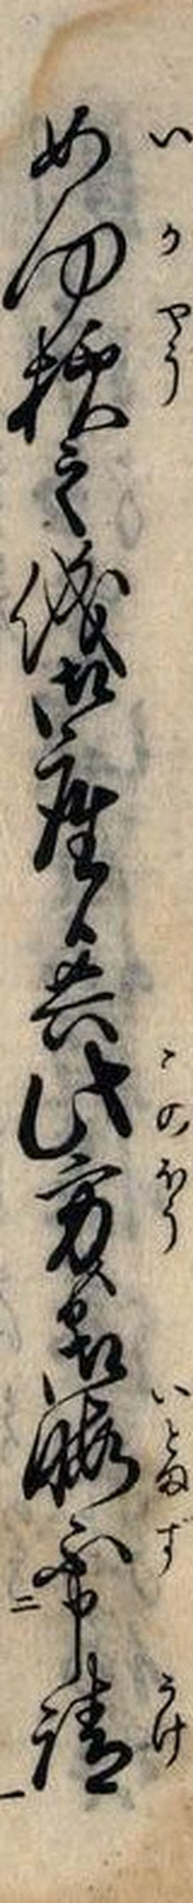如何様之儀御座候共此方ゟ御暇不申請
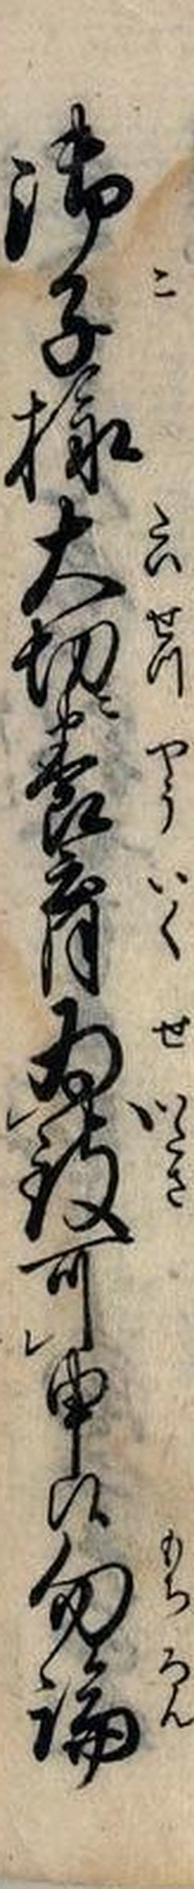御子様大切に養育為致可申候勿論
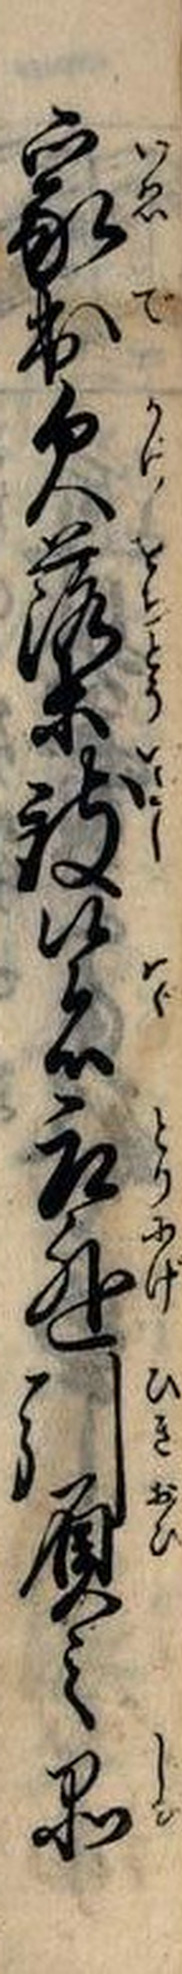家出欠落等致候者取逃引負之品
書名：大成用文章（往来物）
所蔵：福井県文書館 Fukui Prefectural Archives
